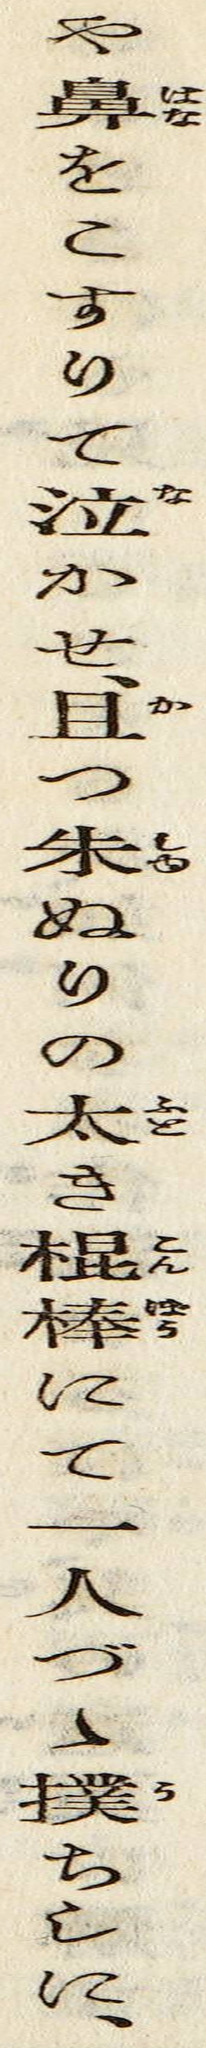や鼻をこすりて泣かせ、且つ朱ぬりの太き棍棒にて一人づゝ撲ちしに、
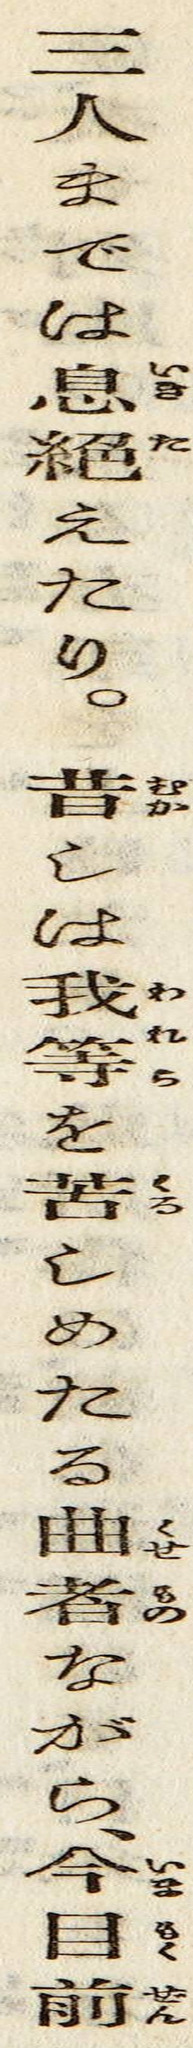三人までは息絶えたり。昔しは我等を苦しめたる曲者ながら、今目前
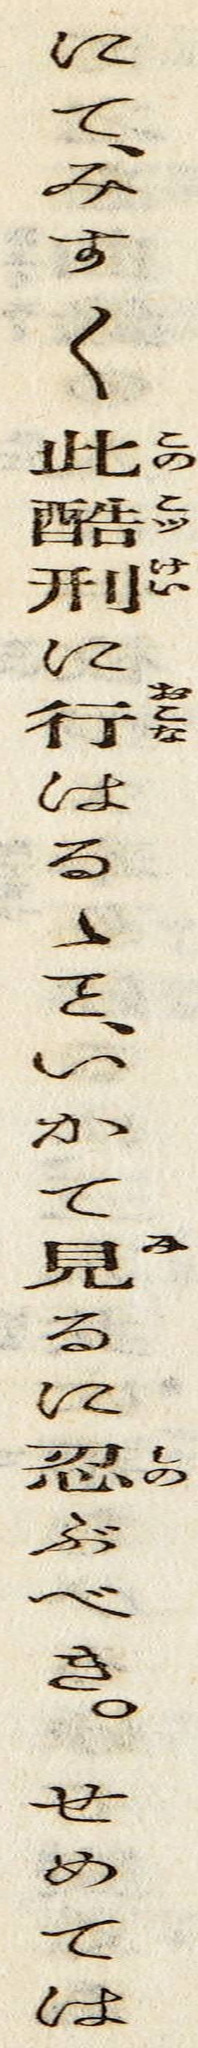にて、みす〳〵此酷刑に行はるゝこと、いかて見るに忍ぶべき。せめては
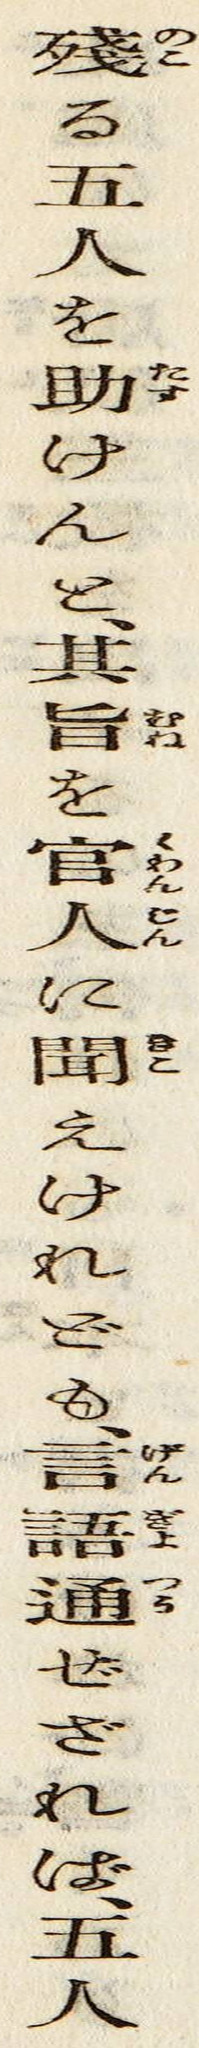残る五人を助けんと、其旨を官人に聞えけれども、言語通ぜざれば、五人
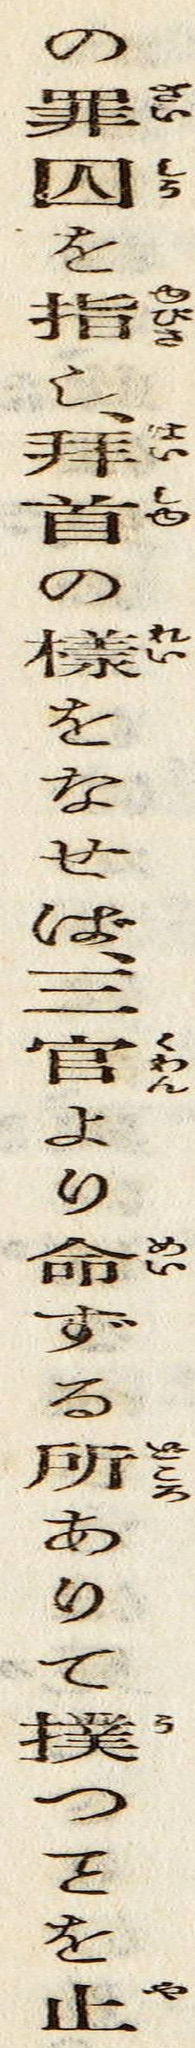の罪囚を指し、拝首の様をなせば、三官より命ずる所ありて撲つことを止
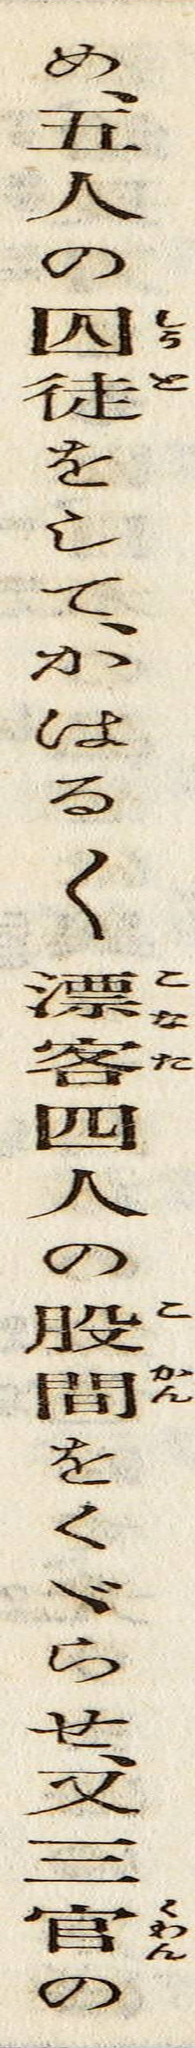め、五人の囚徒をして、かはる〳〵漂客四人の股間をくヾらせ、又三官の
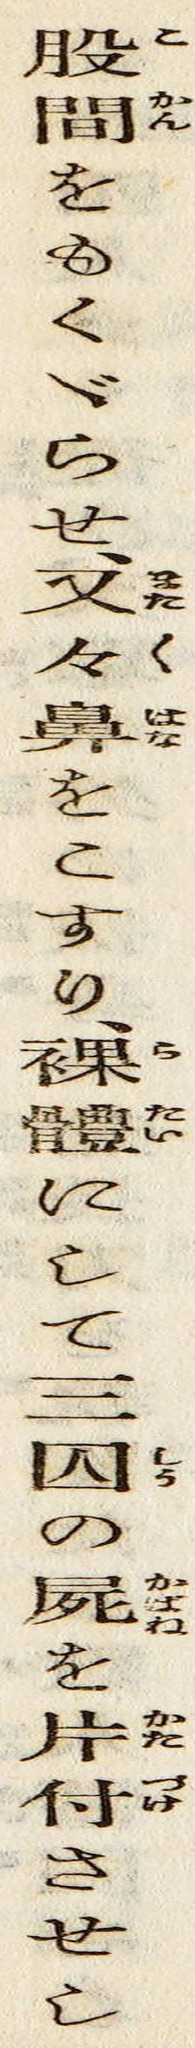股間をもくヾらせ、又々鼻をこすり、裸体にして三囚の屍を片付させし
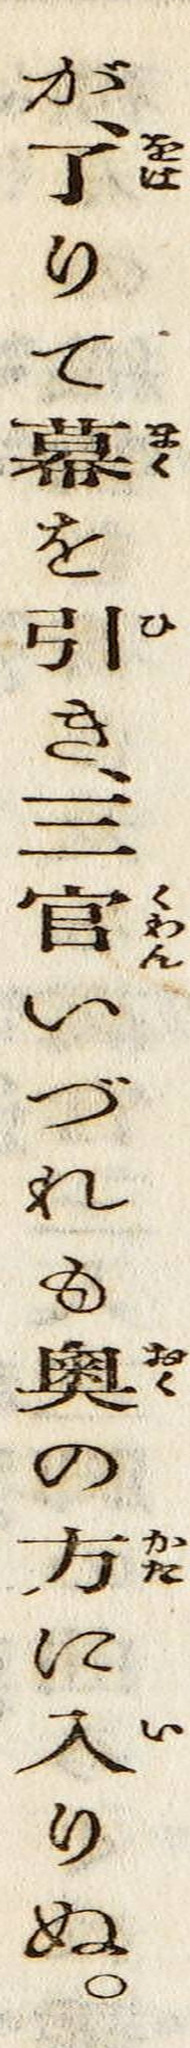が、了りて幕を引き、三官いづれも奥の方に入りぬ。
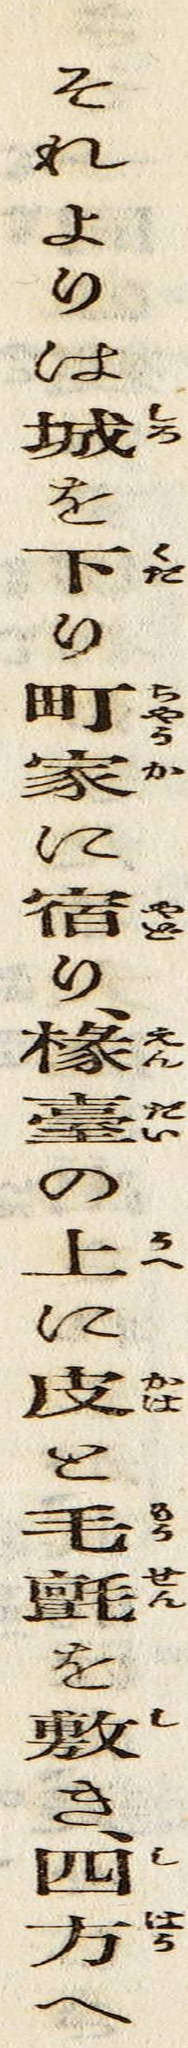それよりは城を下り町家に宿り、椽台の上に皮と毛氈を敷き、四方へ
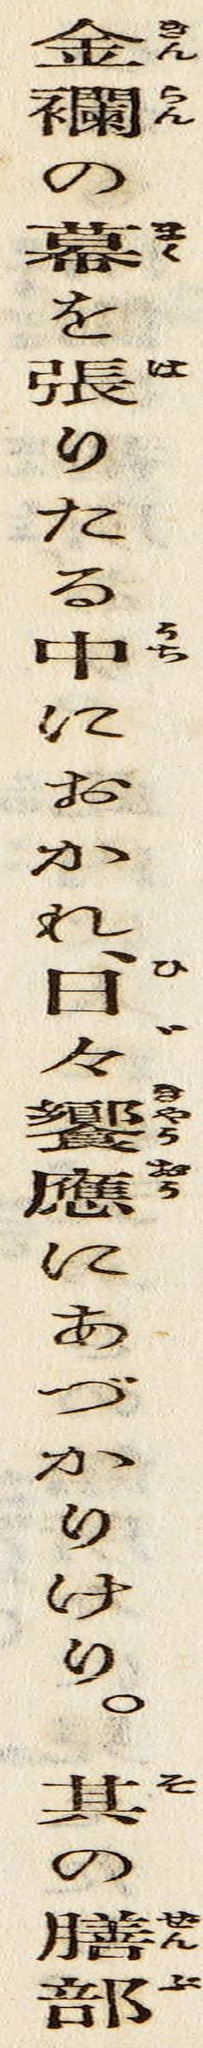金襴の幕を張りたる中におかれ、日々饗応にあづかりけり。其の膳部
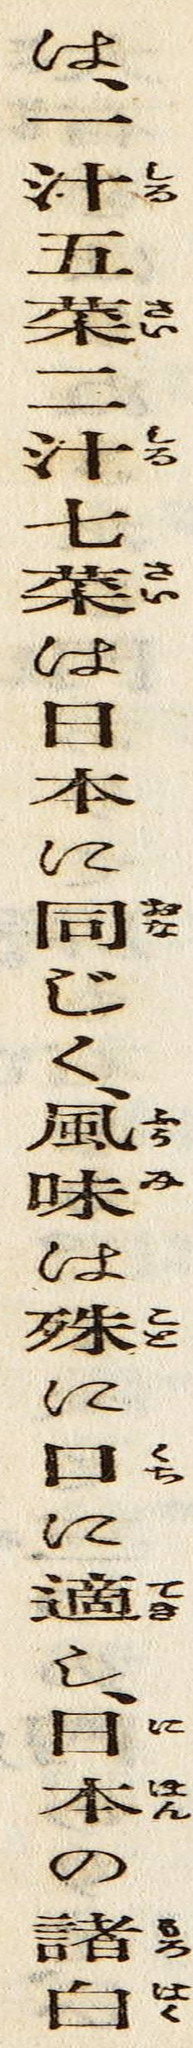は、一汁五菜二汁七菜は日本に同じく、風味は殊に口に適し、日本の諸白
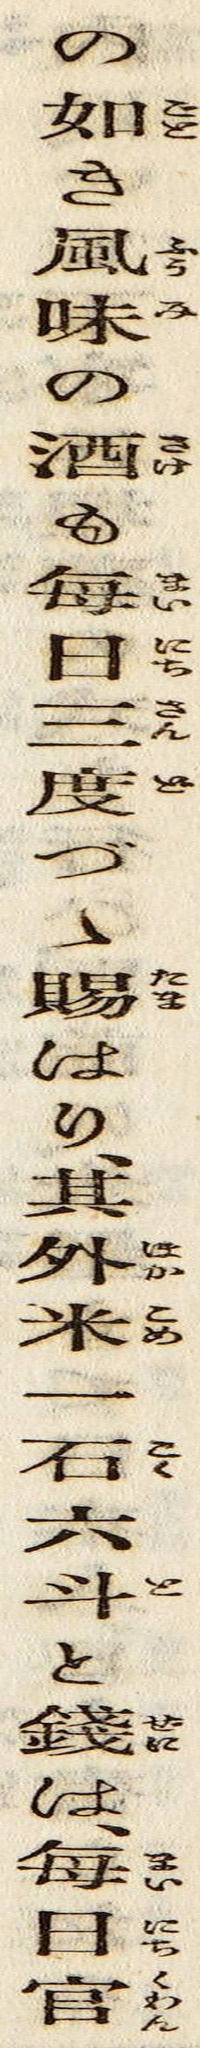の如き風味の酒も毎日三度づゝ賜はり、其外米一石六斗と銭は、毎日官
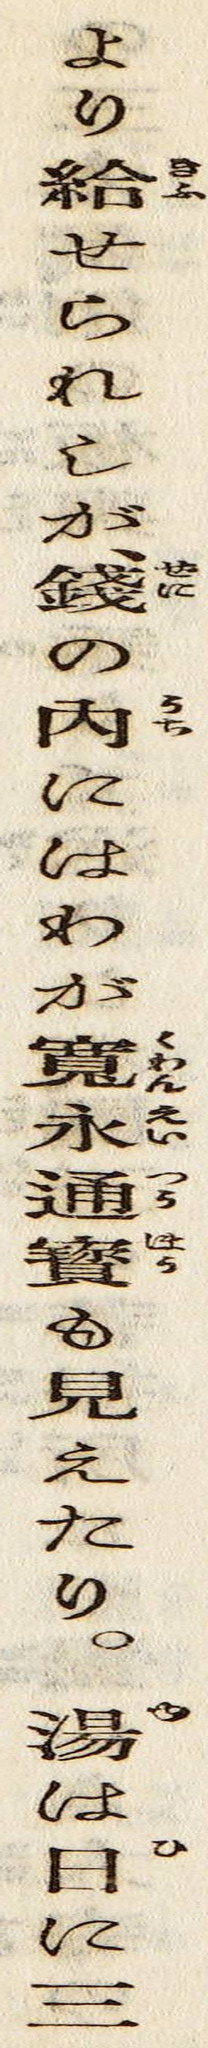より給せられしが、銭の内にはわが寛永通宝も見えたり。湯は日に三
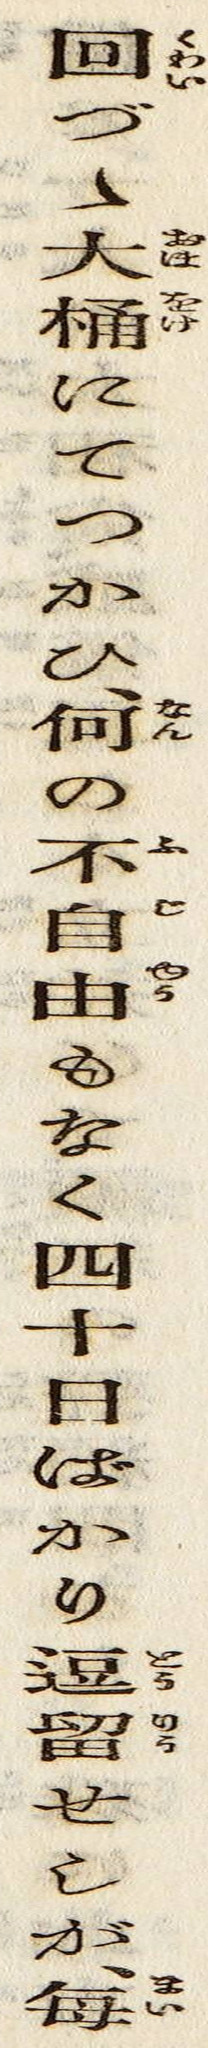回づゝ大桶にてつかひ、何の不自由もなく四十日ばかり逗留せしが、毎
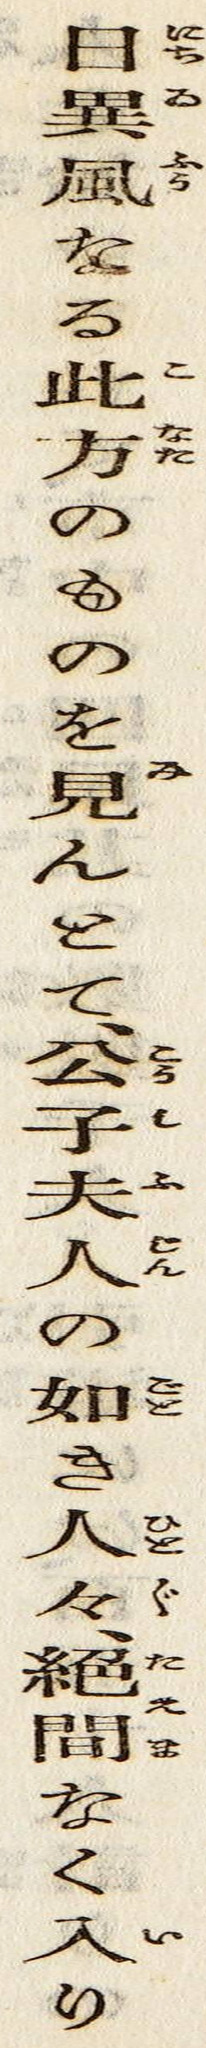日異風なる此方のものを見んとて、公子夫人の如き人々、絶間なく入り
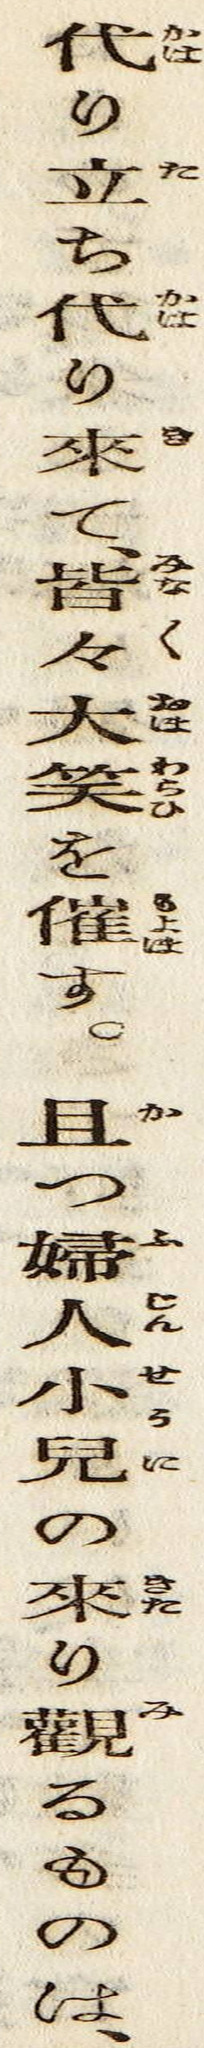代り立ち代り来て、皆々大笑を催す。且つ婦人小児の来り観るものは、
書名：日本漂流譚
